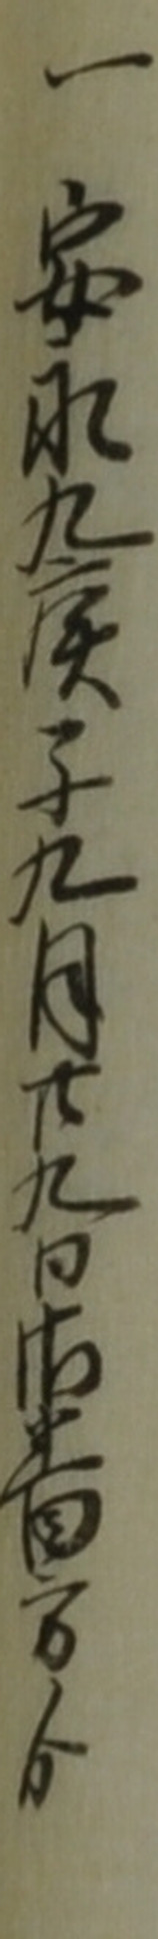一安永九庚子九月廿九日御番方ゟ
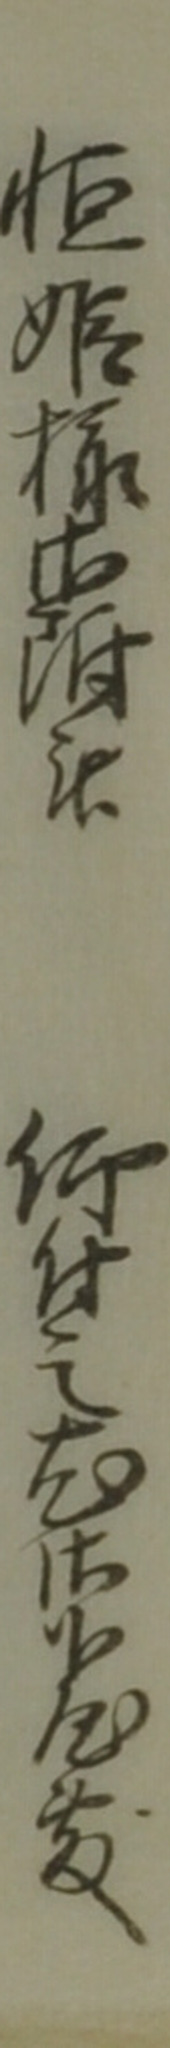恒姫様御附被仰付之尤御下屋敷
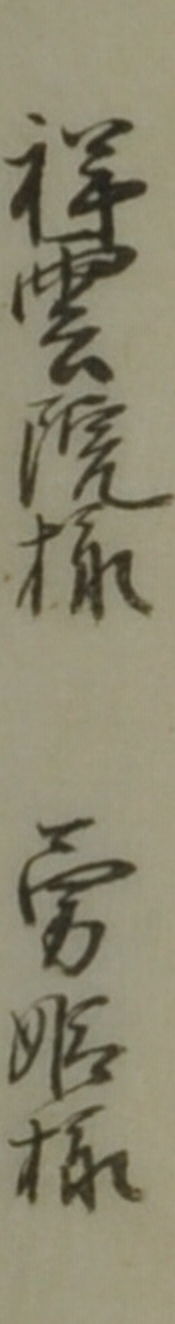祥雲院様勇姫様
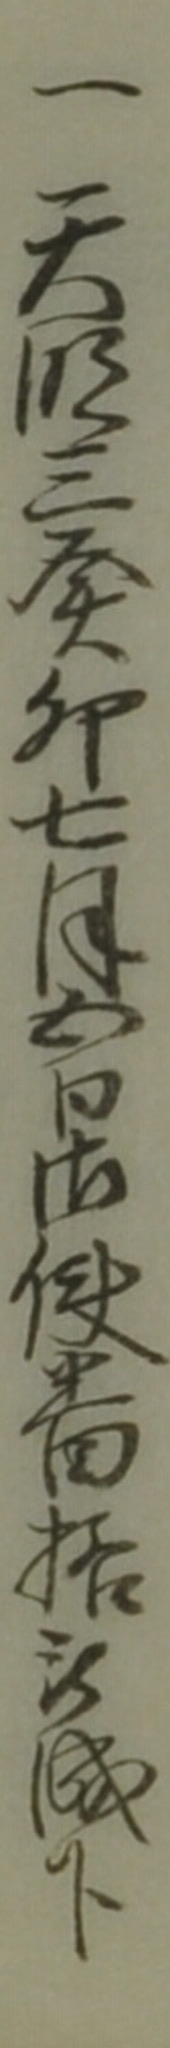一天明三癸卯七月五日御使番格被成下
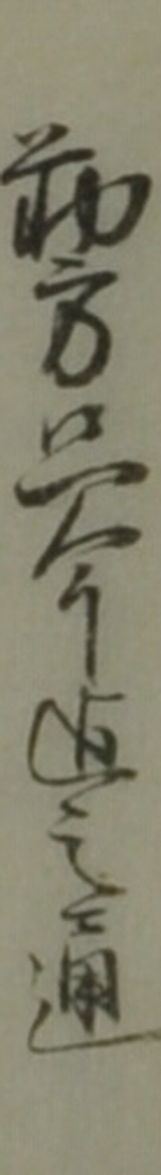勤方只今迄之通
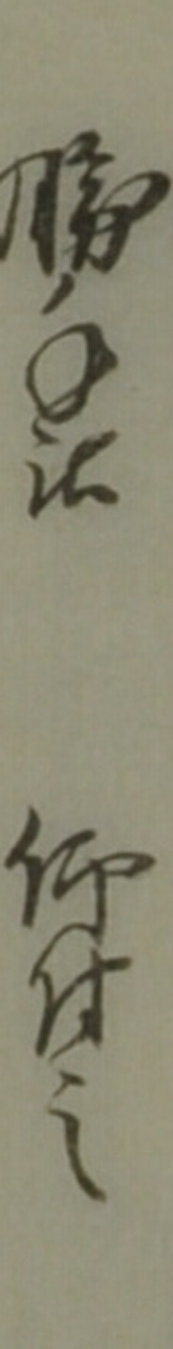勝手被仰付之
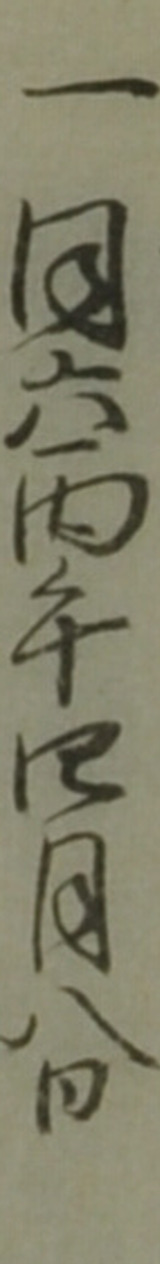一同六丙午四月八日
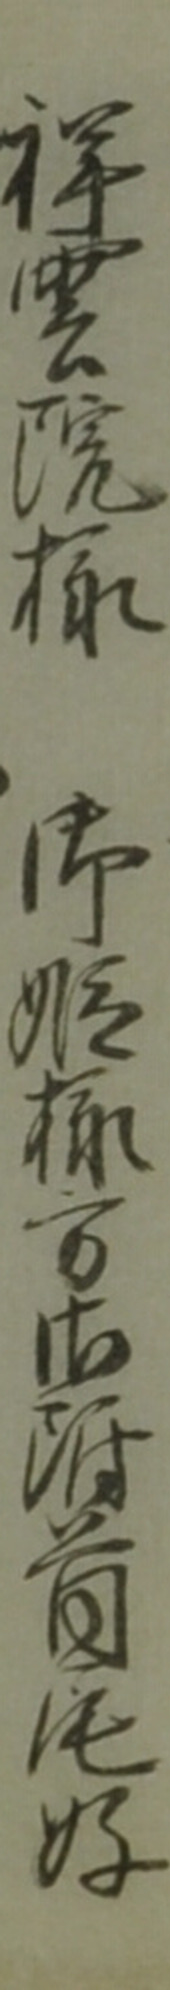祥雲院様御姫様方御附首尾好
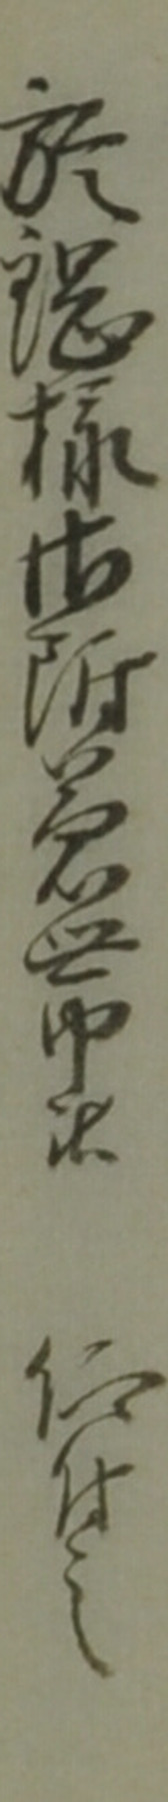於鍉様御附兼帯被仰付之
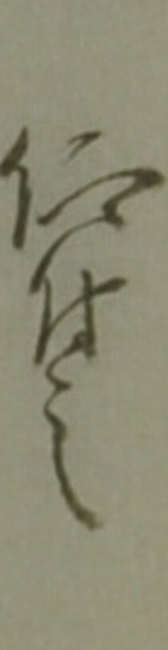仰付之
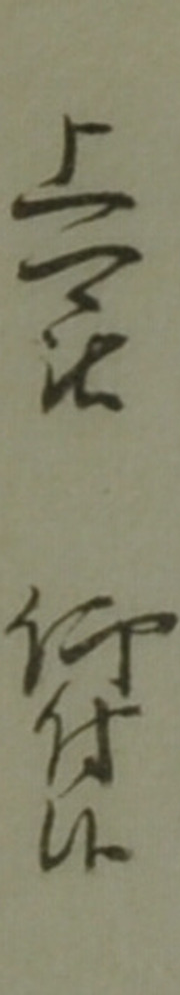上可被仰付之
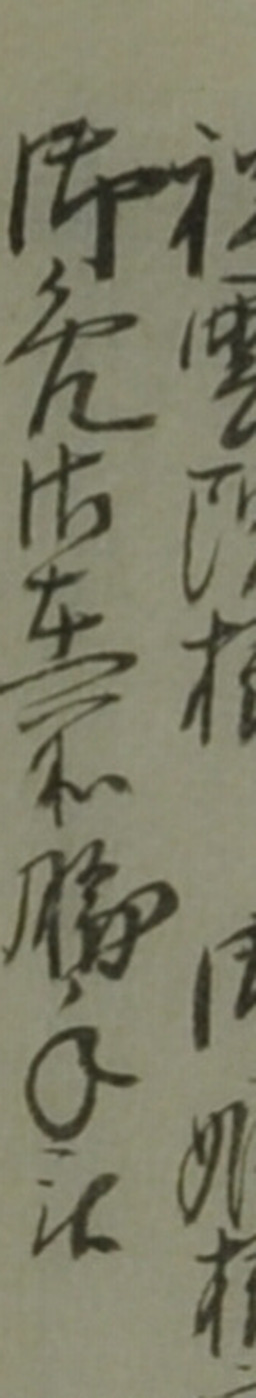御免御在所勝手被
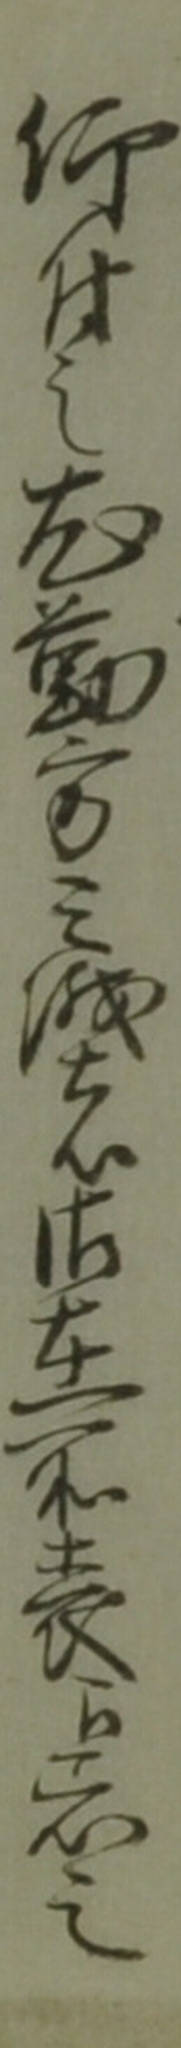仰付之尤勤方之俄者座御在所表江者之
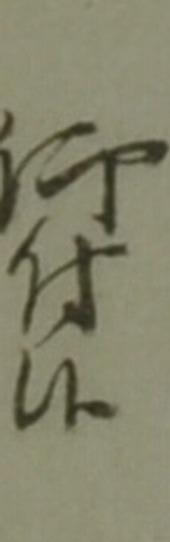仰付之
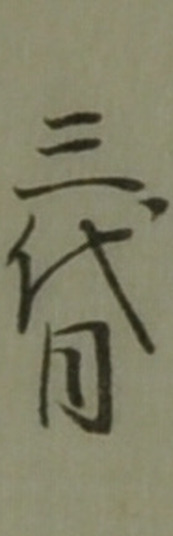三代目
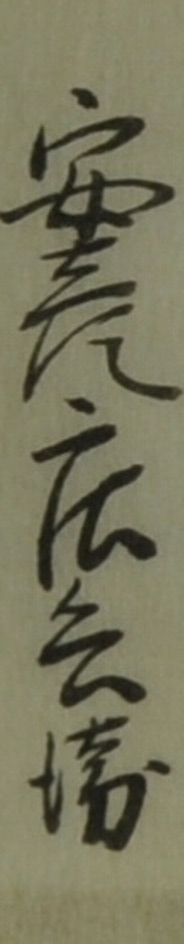安彦庄兵衛
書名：諸御役代々録（六）
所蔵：伊那市立高遠町図書館・合同会社AMANE
